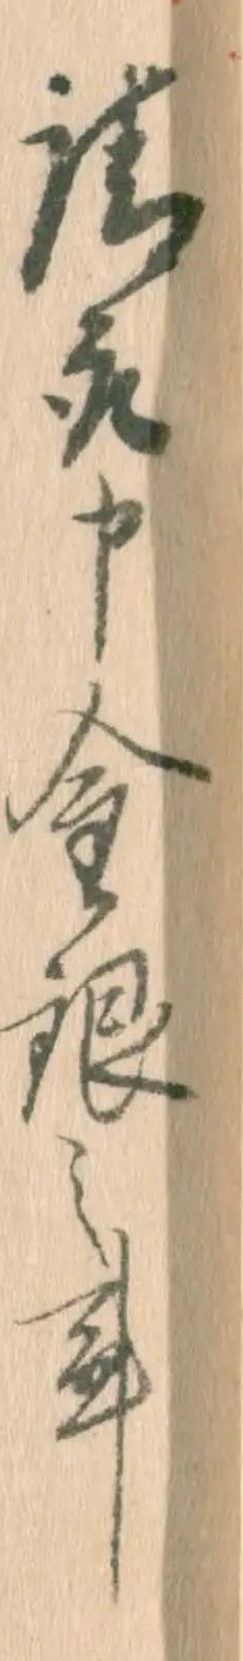請取申金銀之事
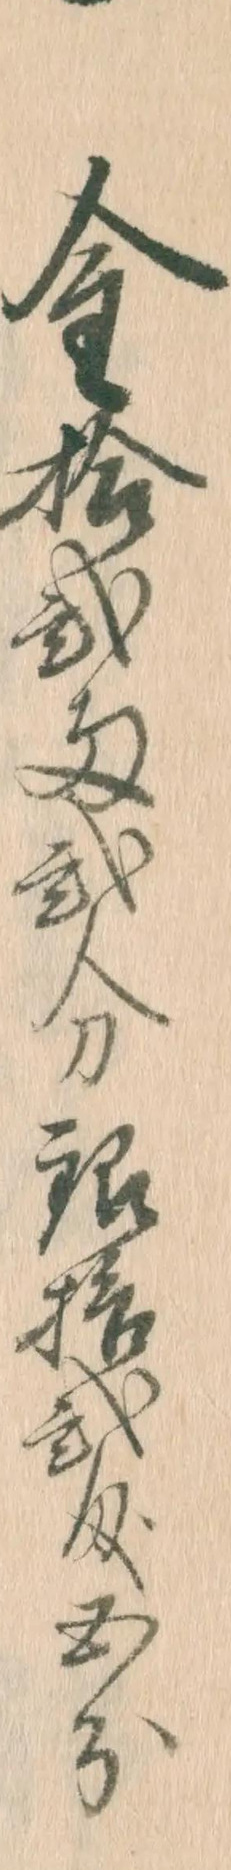一金拾弐両弐分銀拾弐匁五分
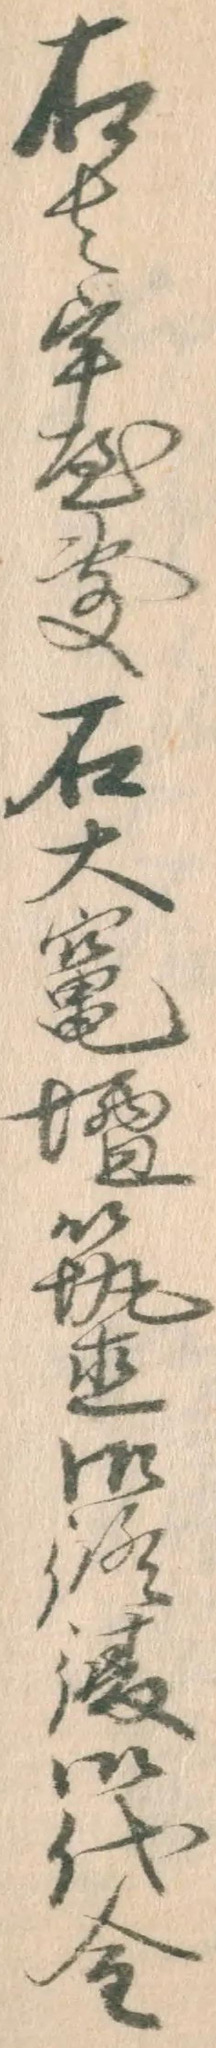右は牢屋敷石大竈壇筑直御修復御代金
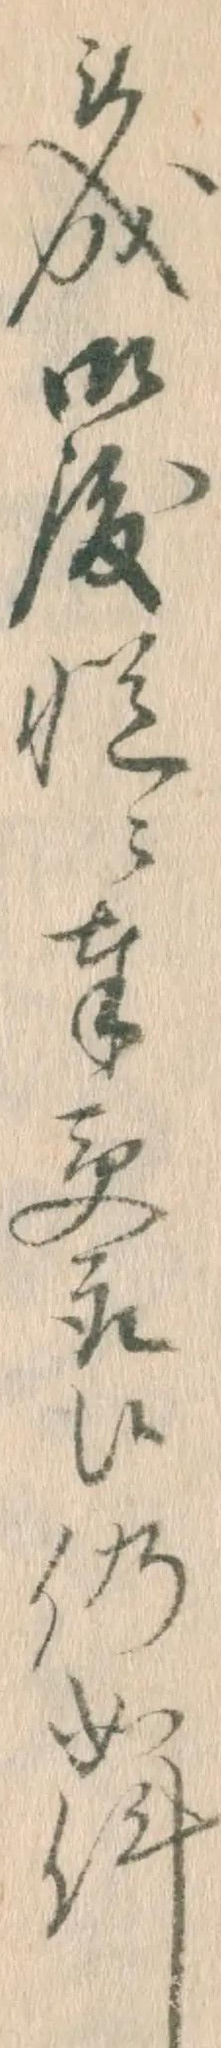被成御渡慥ニ奉受取候仍如件
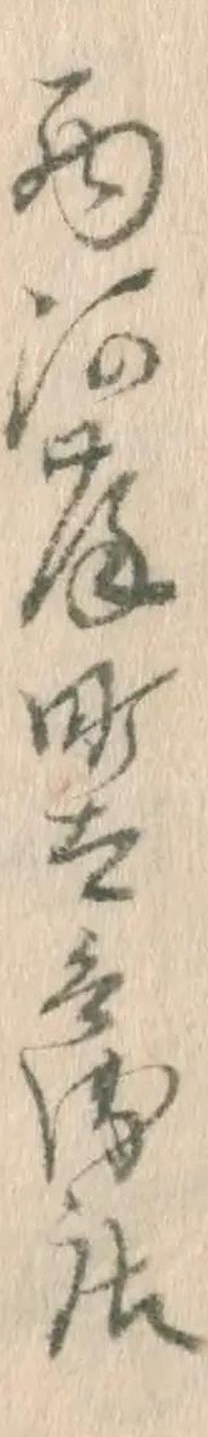西河岸町太兵衛店
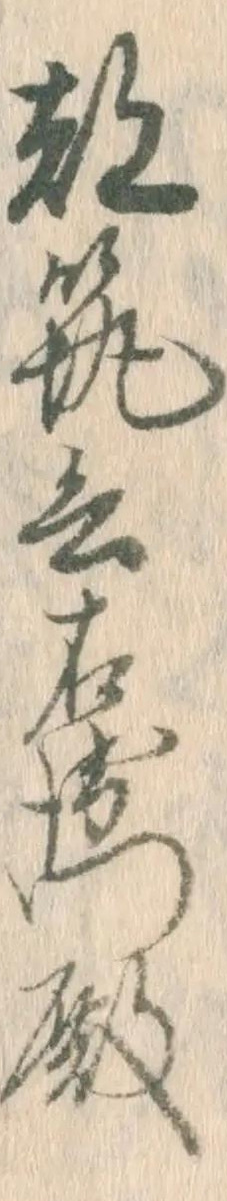都筑兵右衛門殿
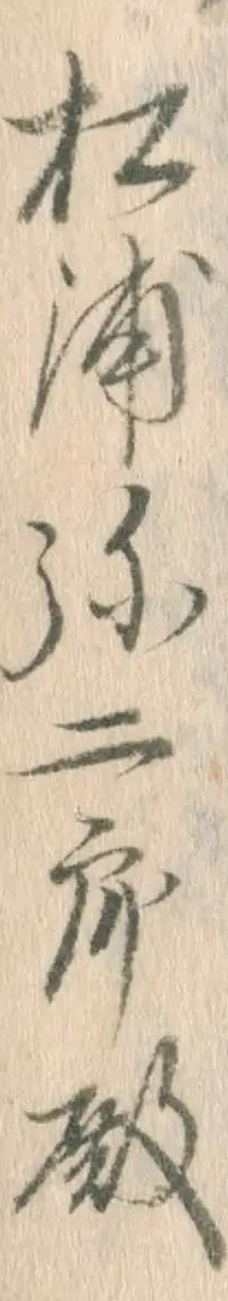松浦弥二郎殿

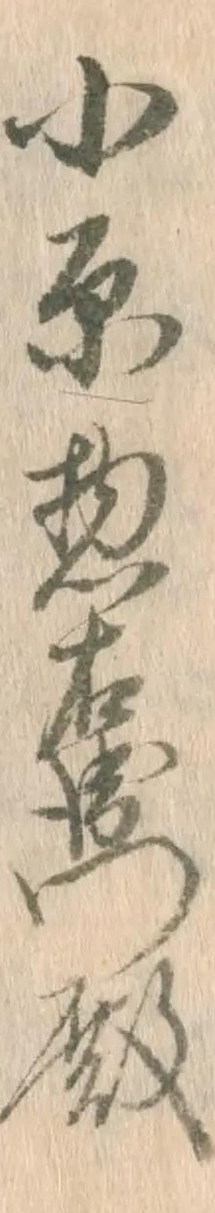小原惣右衛門殿
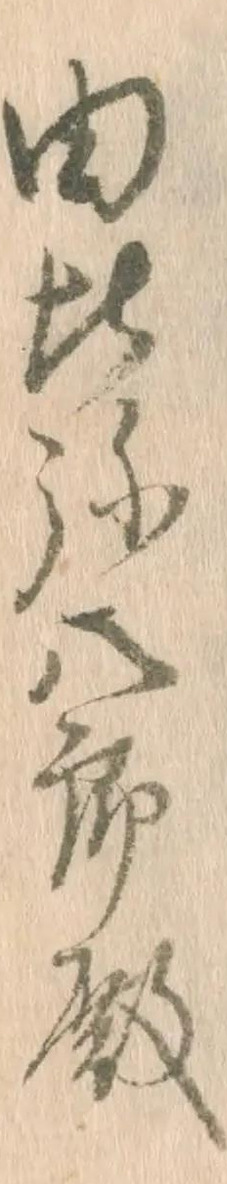由比弥八郎殿
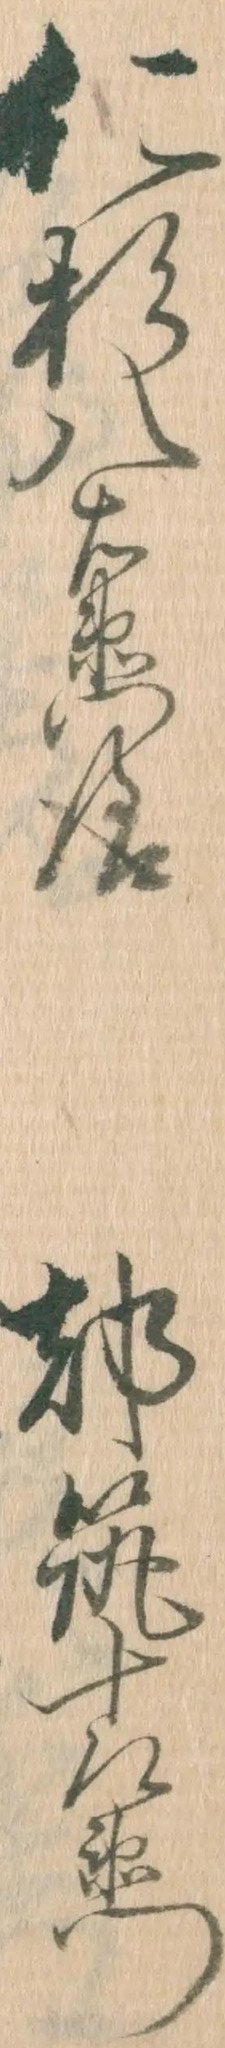仁杉八右衛門様都筑十左衛門
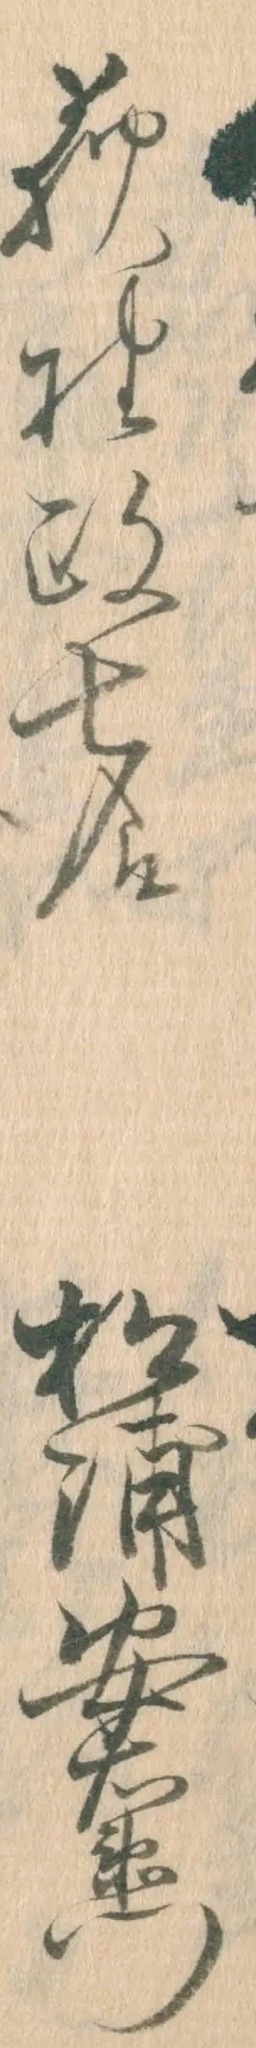荻野政七様松浦安右衛門
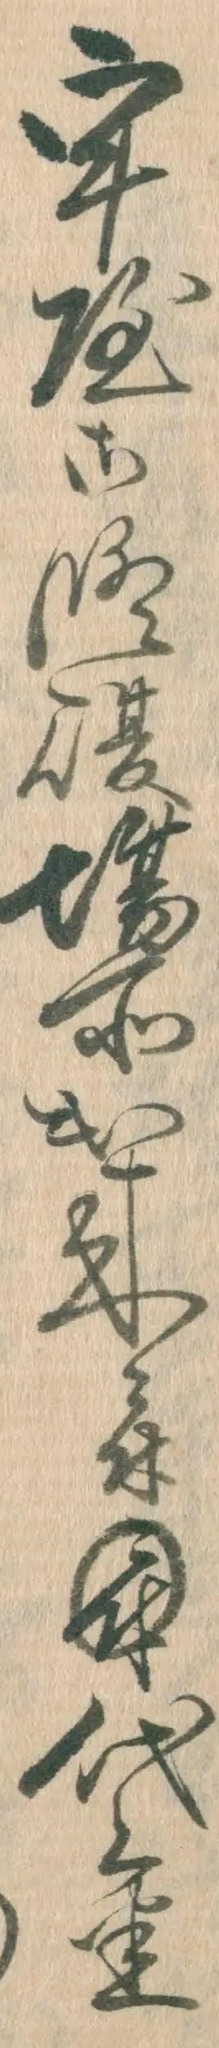牢屋御修復場所出来ニ付ニ付代金
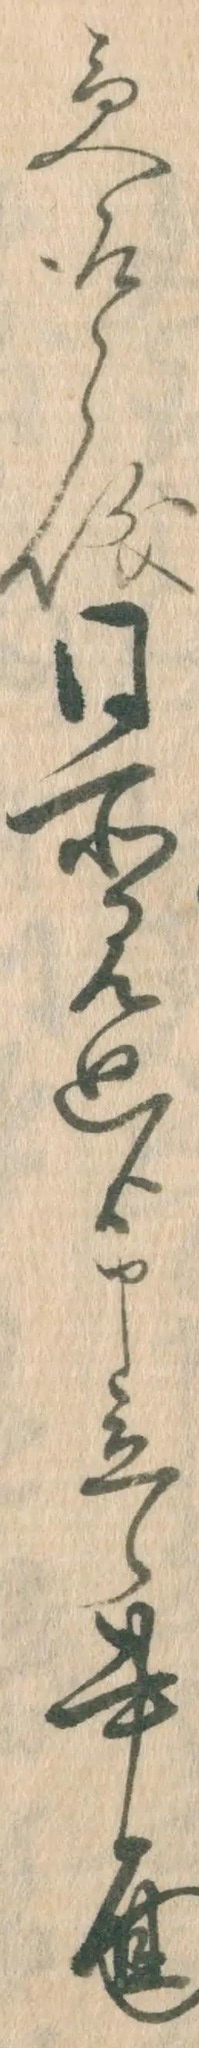受取候儀同所見廻ゟ申立候書面
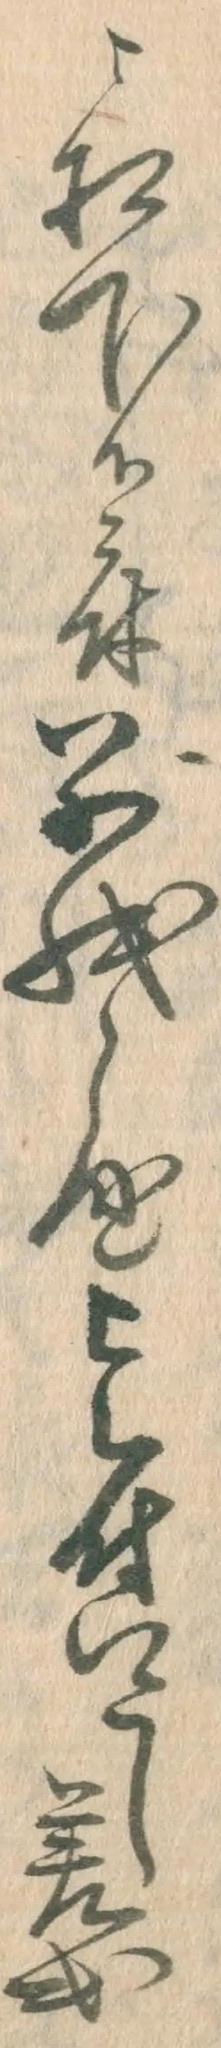被相下候ニ付別紙之通ヒレ付にて差出

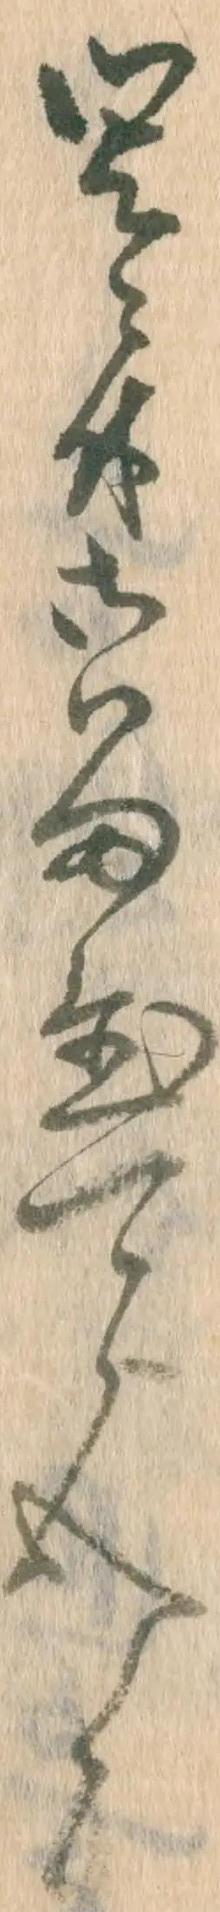御尤ニ付御留置可被成候
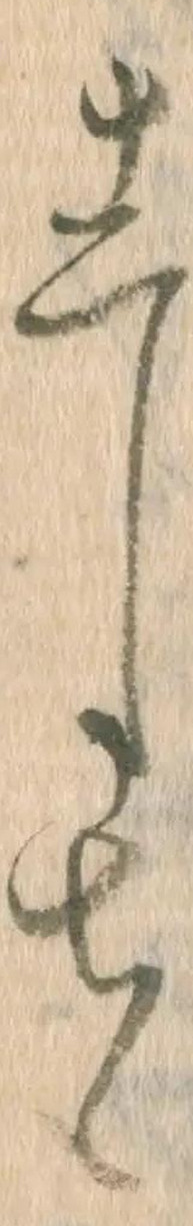十二月七日
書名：七十冊物類集 71巻. [44] 四十三 牢屋敷御普請御修覆地震ニ付骨折候牢屋掛御褒美之部
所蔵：国立国会図書館 National Diet Library, JAPAN
